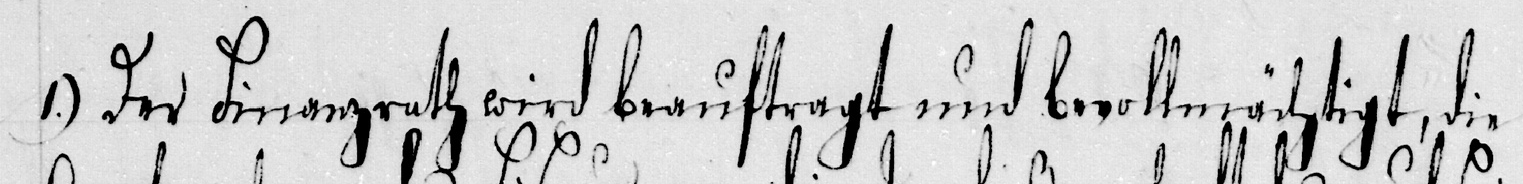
1.) Der Finanzrath wird beauftragt und bevollmächtigt, die
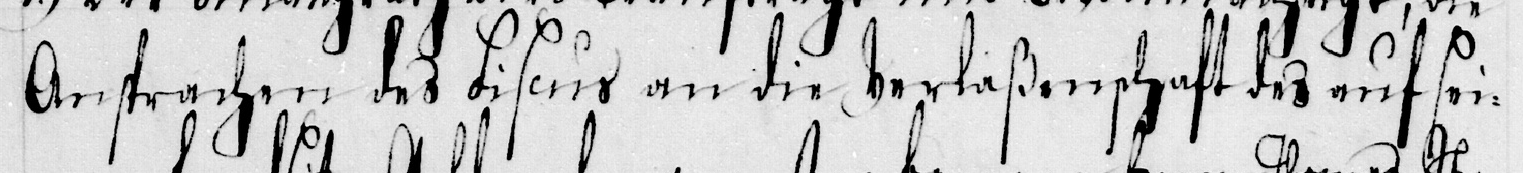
Ansprachen des Fiscus an die Verlaßenschaft des auf sei¬
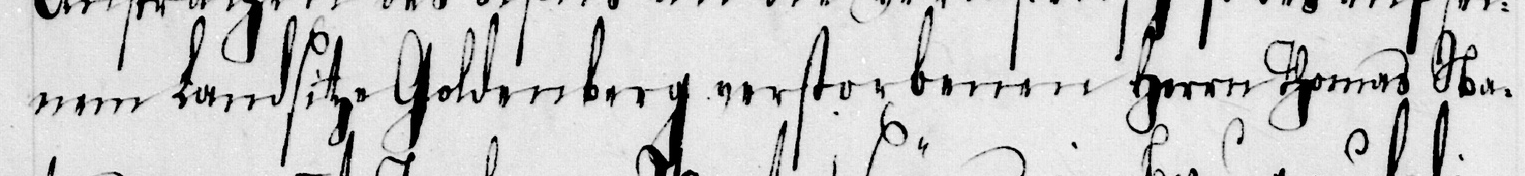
nem Landsitze Goldenberg verstorbenen Herrn Thomas Na¬
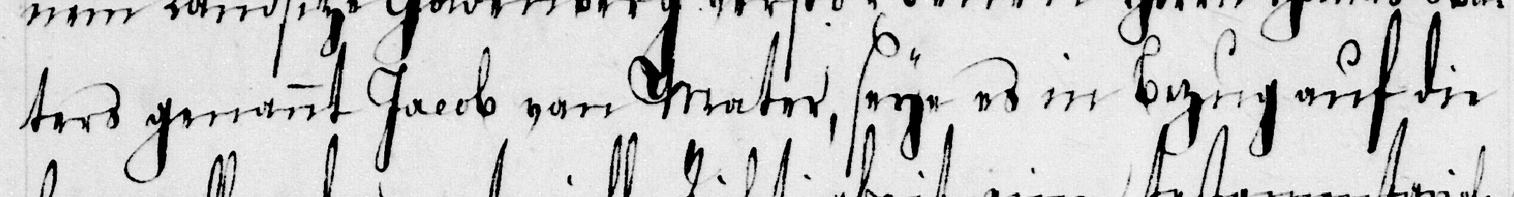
ters genannt Jacob van Mater, seye es in Bezug auf die
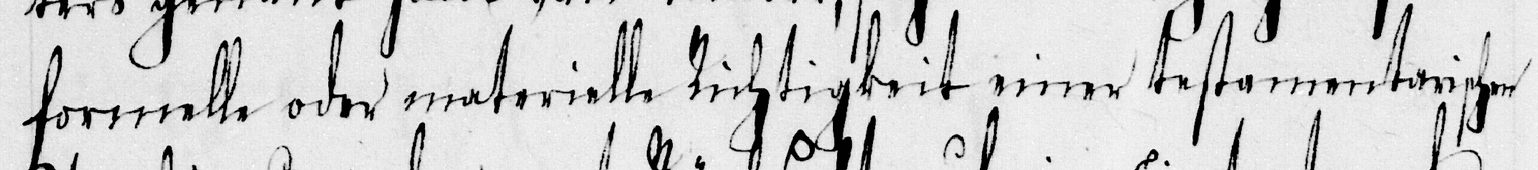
formelle oder materielle Richtigkeit einer testamentarischen
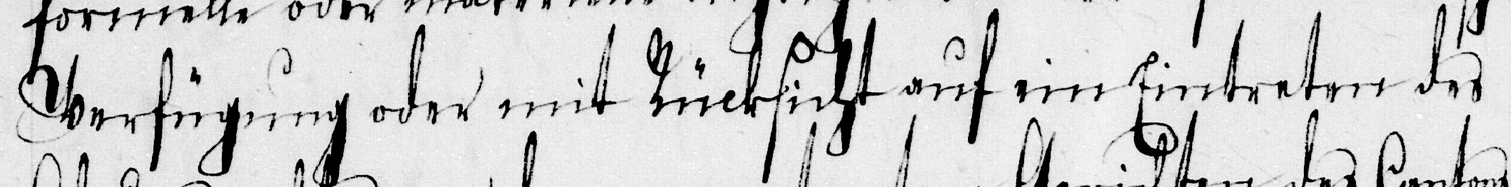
Verfügung oder mit Rücksicht auf ein Eintreten des
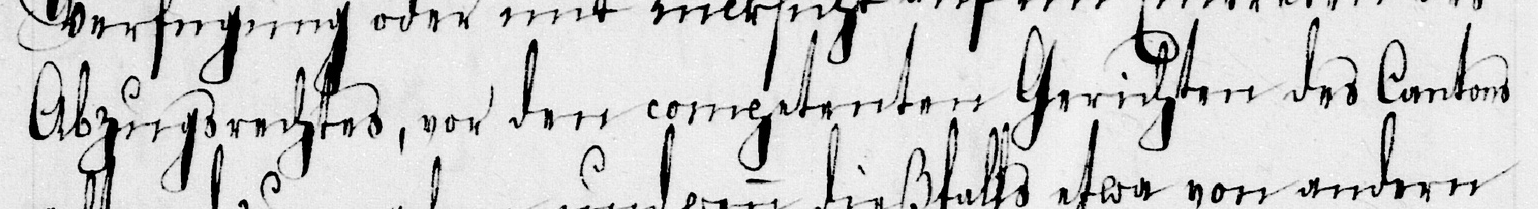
Abzugsrechtes, vor den competenten Gerichten des Cantons
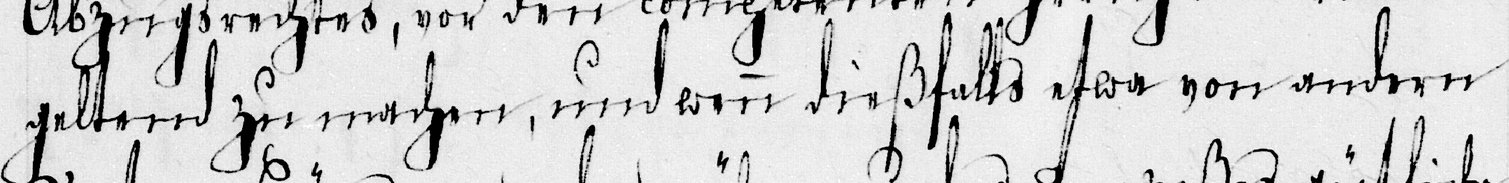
geltend zu machen, und wenn dießfalls von andern
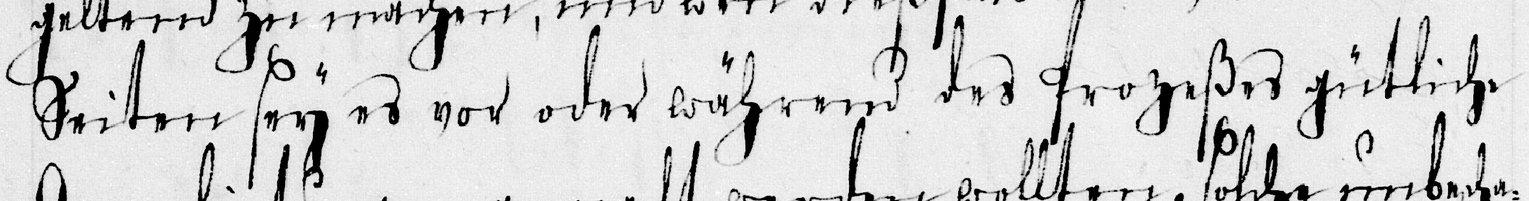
Seiten sey es vor oder während des Prozeßes gütliche
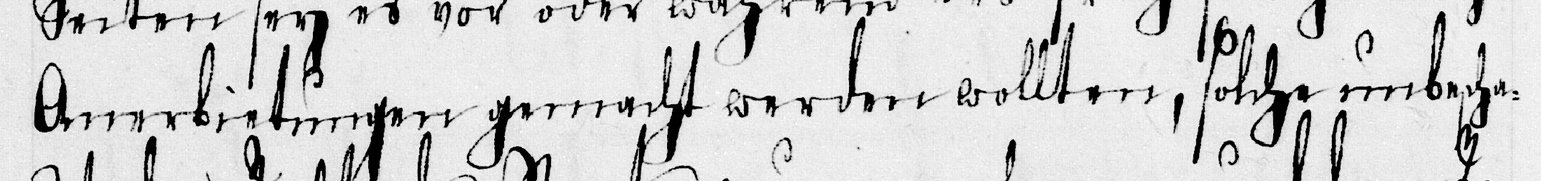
Anerbietungen gemacht werden wollten, solche unbescha¬
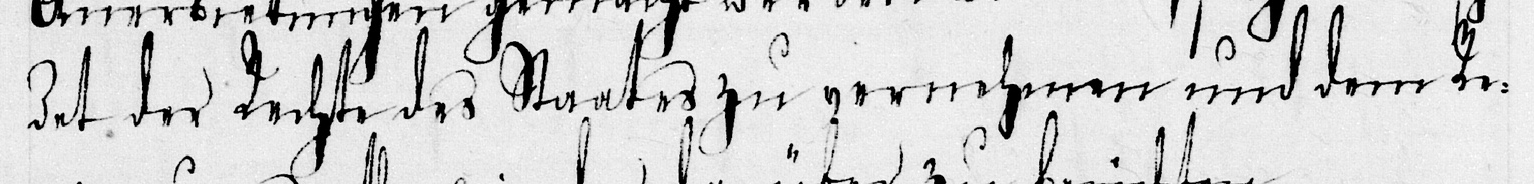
det der Rechte des Staates zu vernehmen und dem Re¬
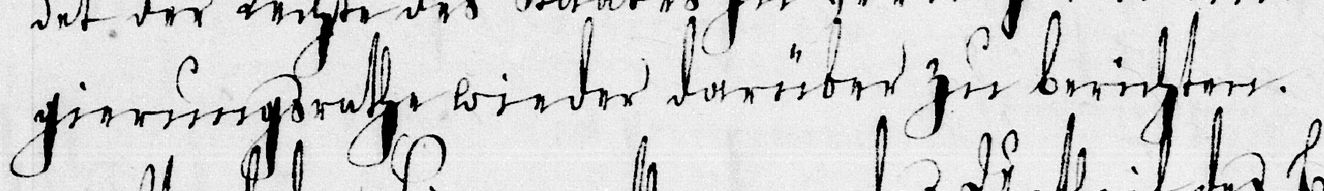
gierungsrathe wieder darüber zu berichten.
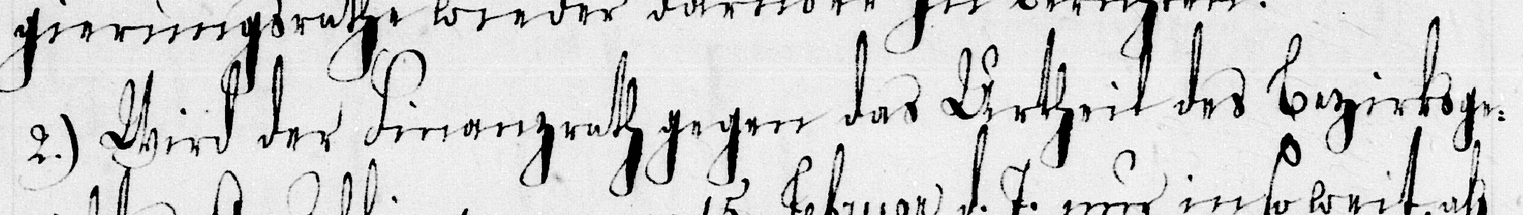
2.) Wird der Finanzrath gegen das Urtheil des Bezirksge¬
